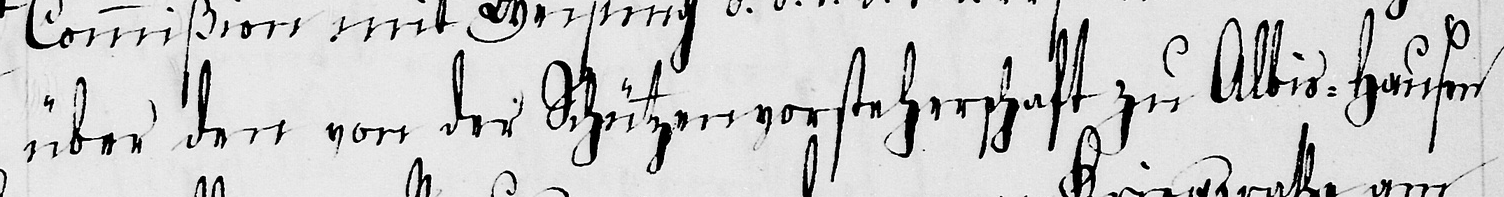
über den von der Schützenvorsteherschaft zu Albis-Hausen
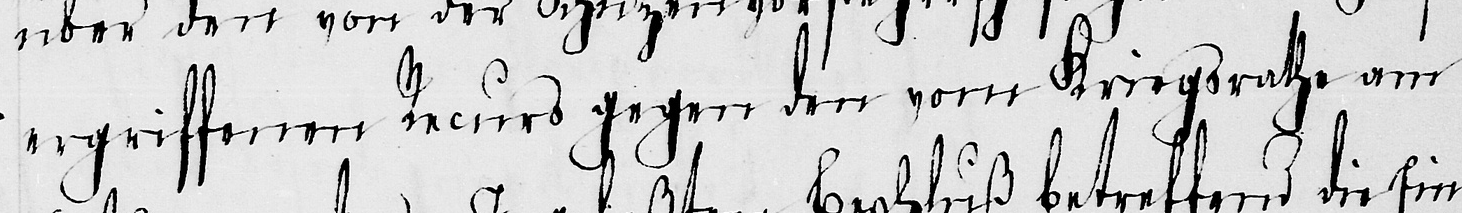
ergriffenen Recurs gegen den vom Kriegsrathe am
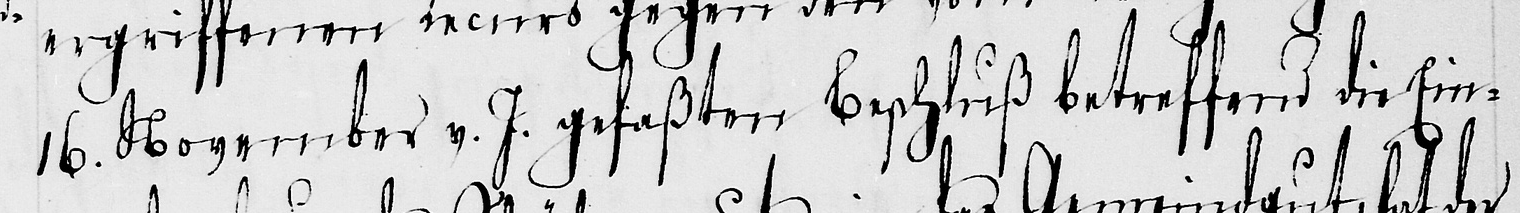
16. November v. J. gefaßten Beschluß betreffend die Ein¬
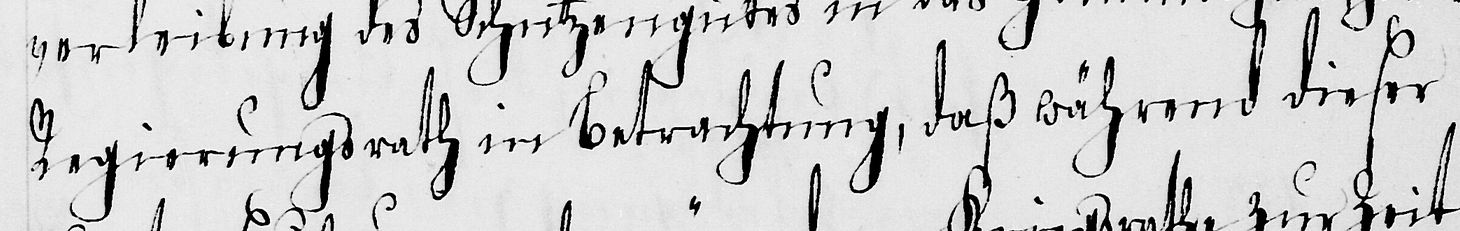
Regierungsrath in Betrachtung, daß während dieser
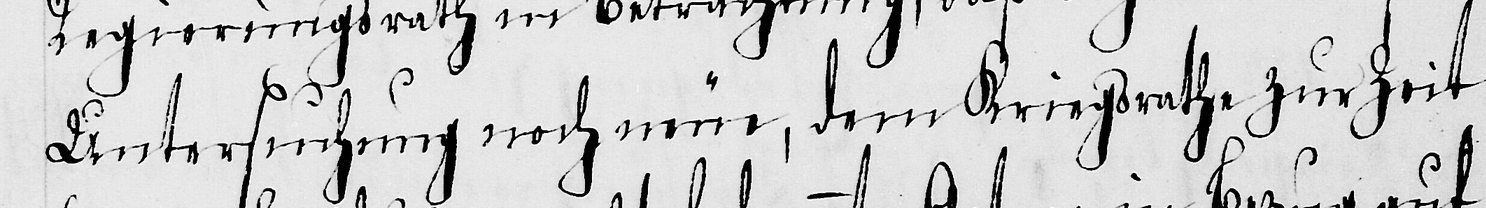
Untersuchung noch neue, dem Kriegsrathe zur Zeit
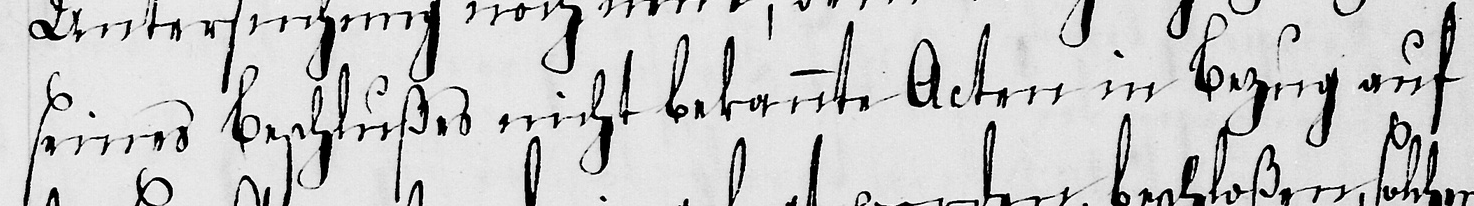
seines Beschlußes nicht bekannte Acten in Bezug auf
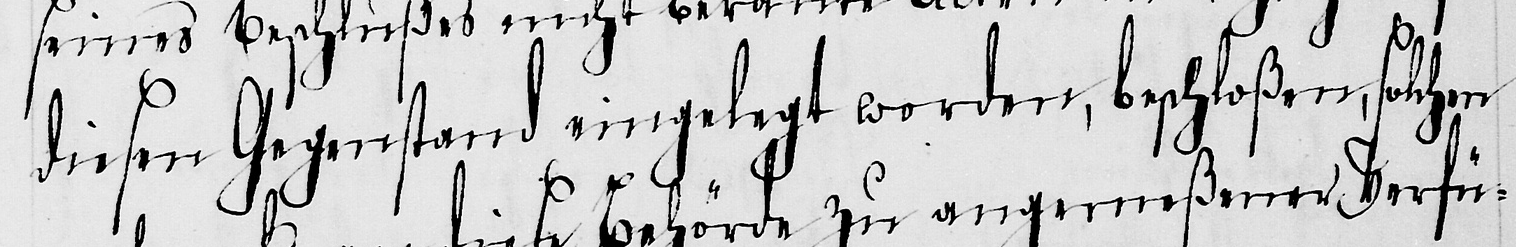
diesen Gegenstand eingelegt worden, beschloßen, solc¬
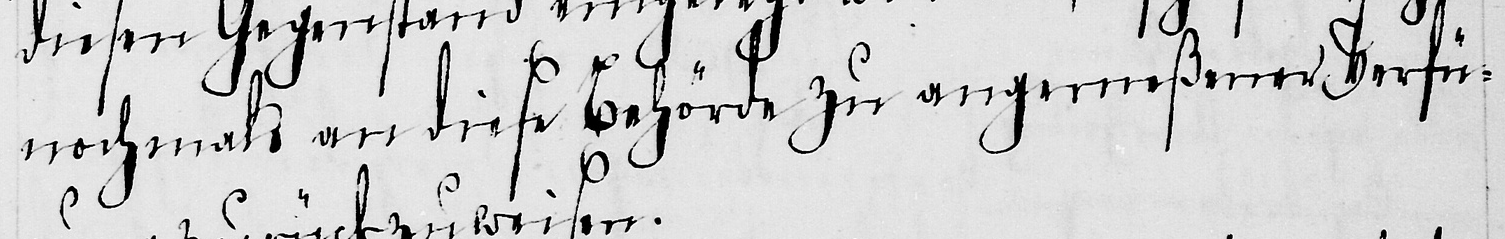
nochmals an diese Behörde zu angemeßener Verfü¬
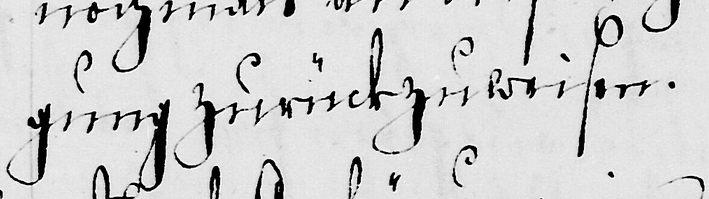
gung zurückzuweisen.
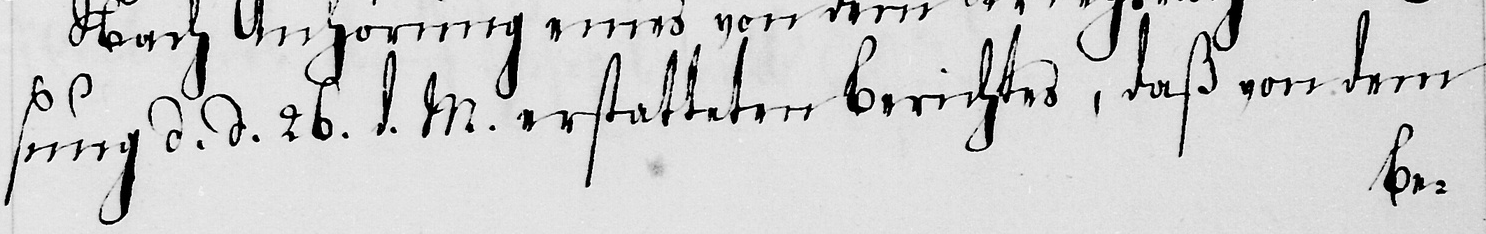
sung d. d. 26. d. M. erstatteten Berichtes, daß von dem
